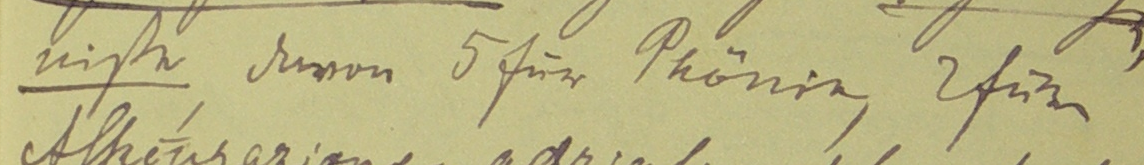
niße, davon 5 für Phönix, 2 für
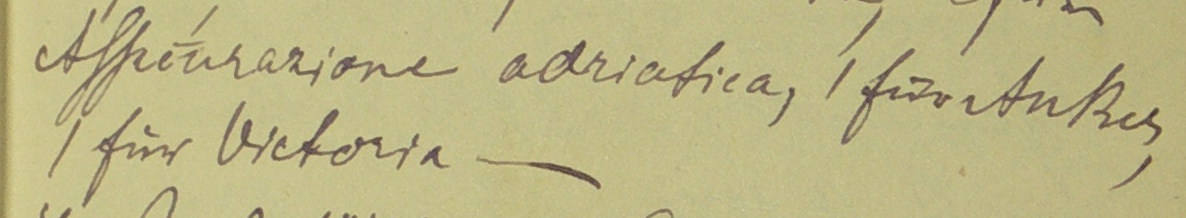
Assicuracione addriatica, 1 für Anker,
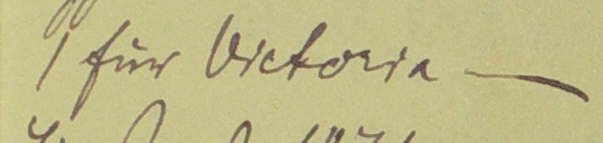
1 für Victoria.
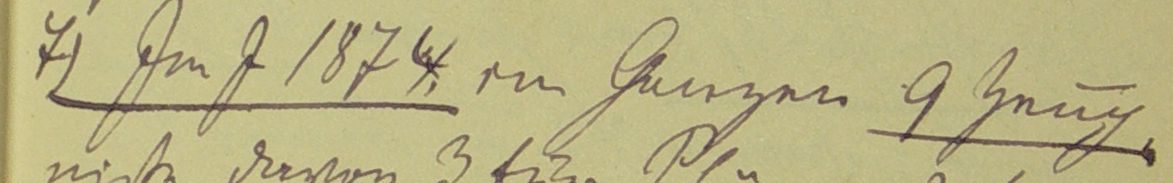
7) Im Jahr 1874 im Ganzen 9 Zeug¬
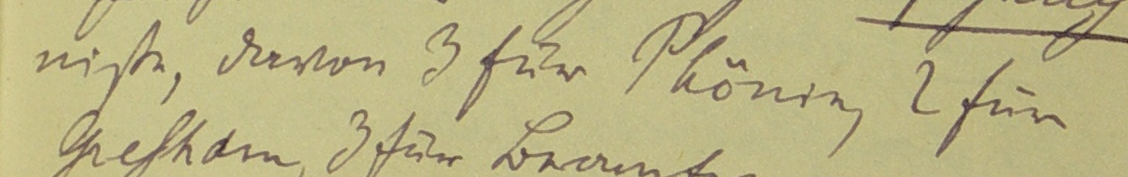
niße, davon 3 für Phönix, 2 für
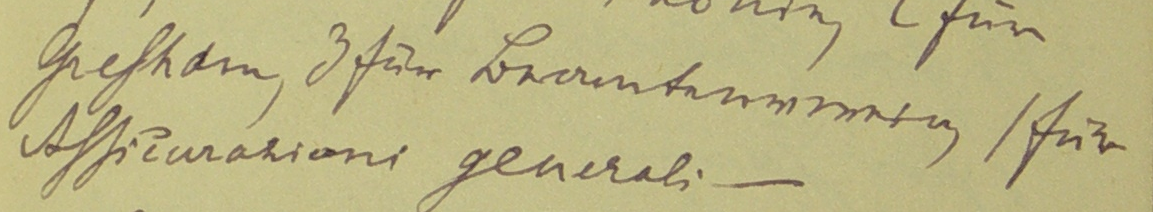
Hestony, 3 für Beamtenversicherung, 1 für
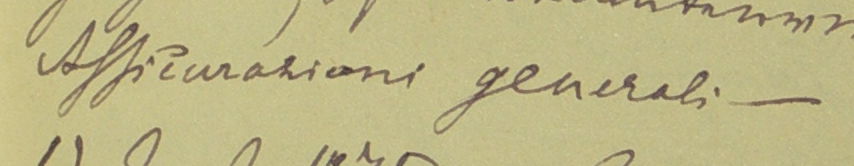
Assicuracione generali.
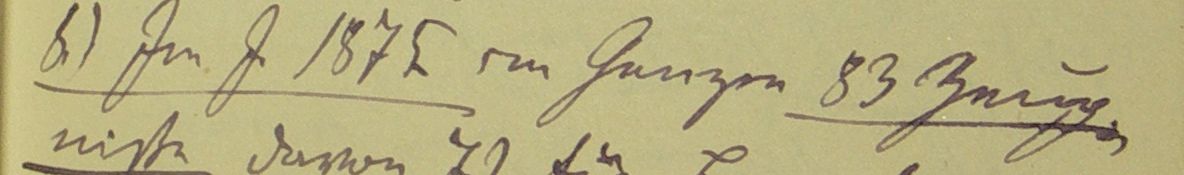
8) Im Jahr 1875 im Ganzen 83 Zeug¬
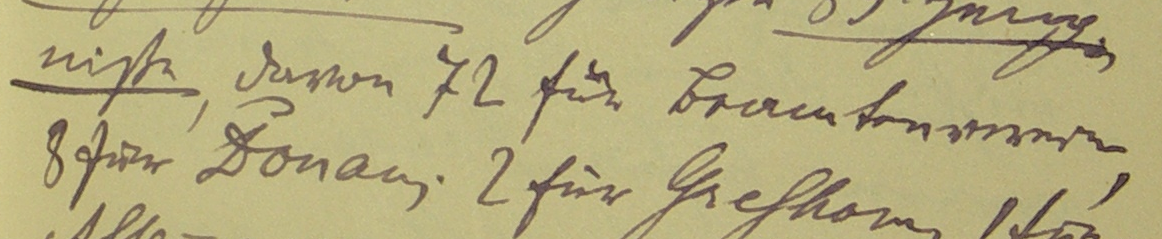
niße, davon 72 für Beamtenversicherung,
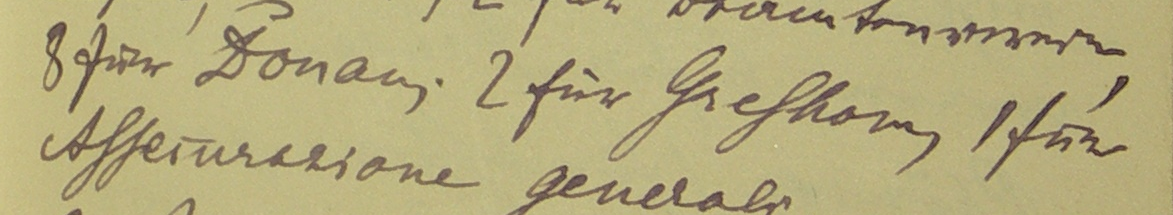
8 für Donau, 2 für Hestony, 1 für
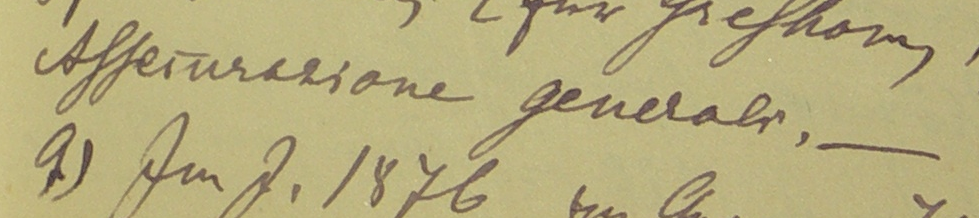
Assicuracione generali.
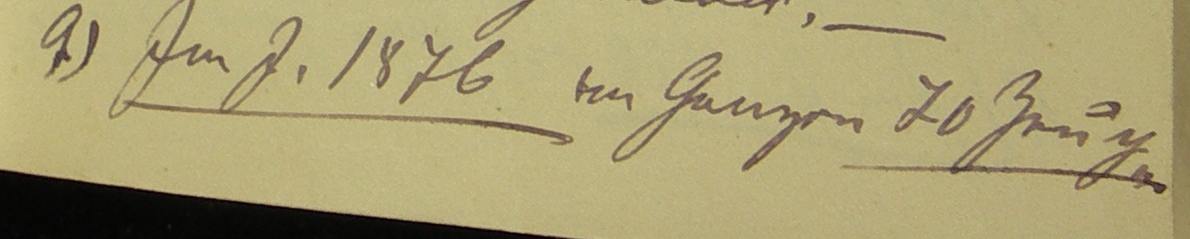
9) Im Jahre 1876 im Ganzen 70 Zeug¬
